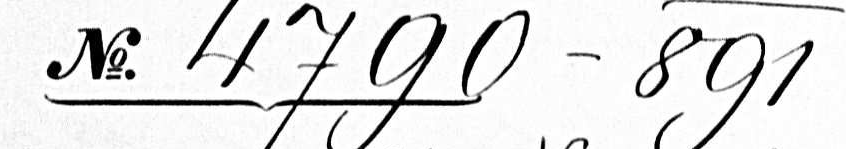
No. 4790 - 1891
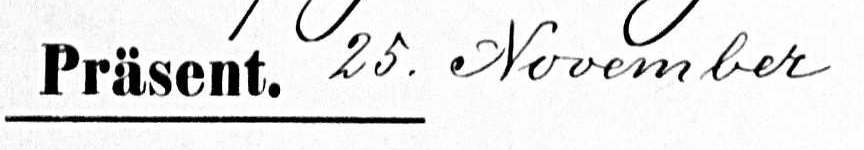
Präsent. 25. November
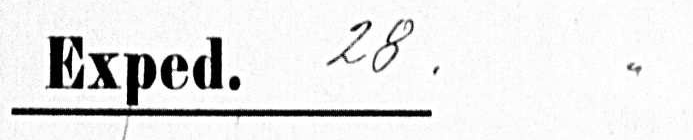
Exped. 28. „
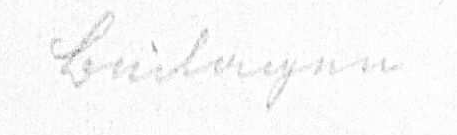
Beilagen
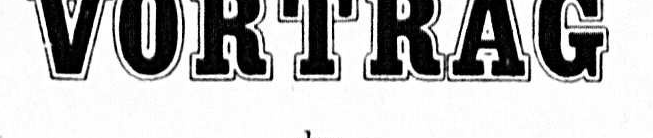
VORTRAG
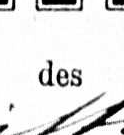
des
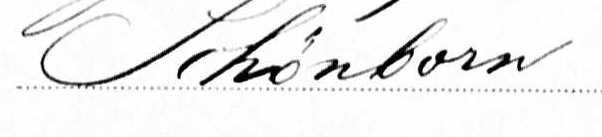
Schönborn
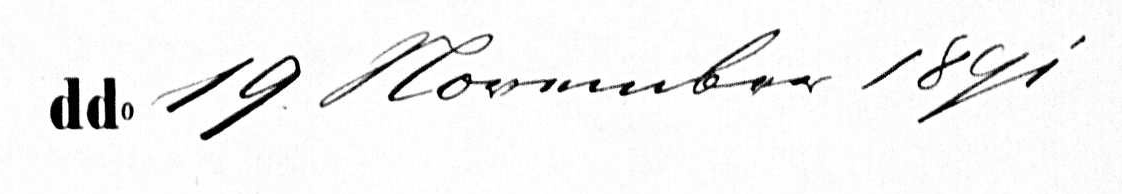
ddo 19. November 1891
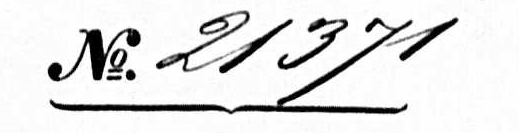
No. 21371
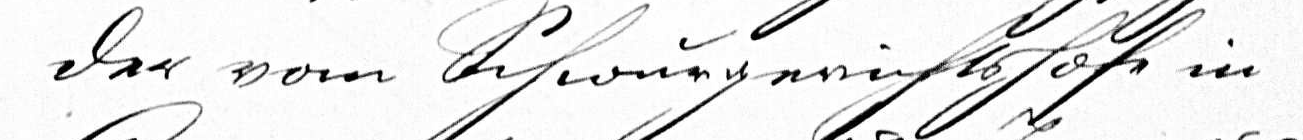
der vom Schwurgerichtshofe in
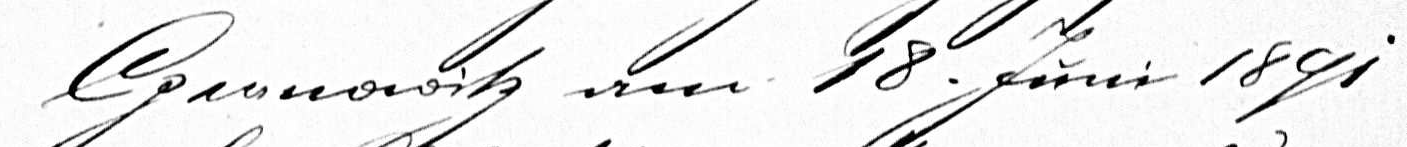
Czernowitz am 18. Juni 1891
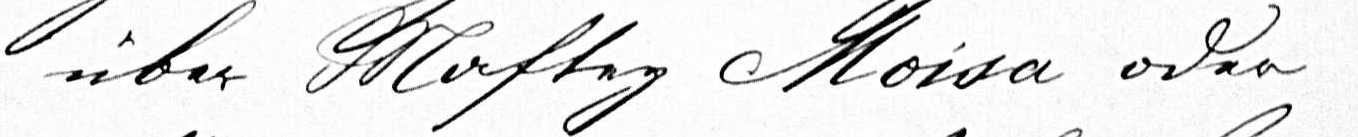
über Maftey Moisa oder
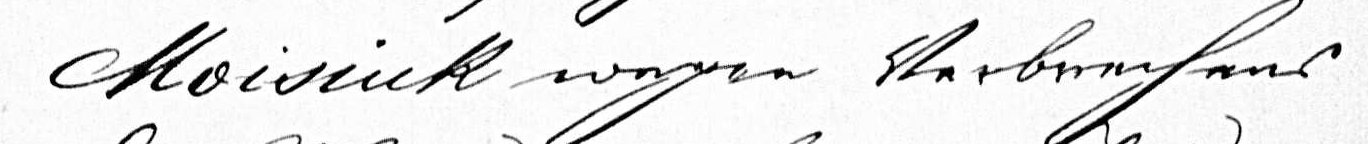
Moisiuk wegen Verbrechens
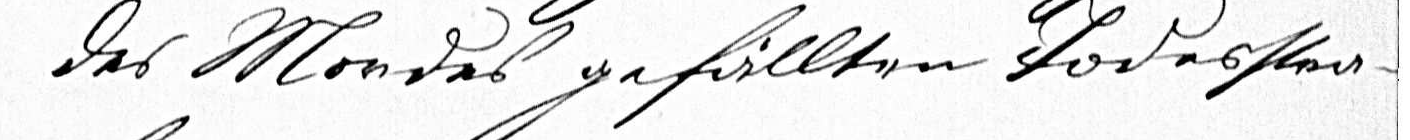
des Mordes gefällten Todesstra¬
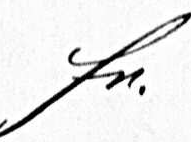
fe.
